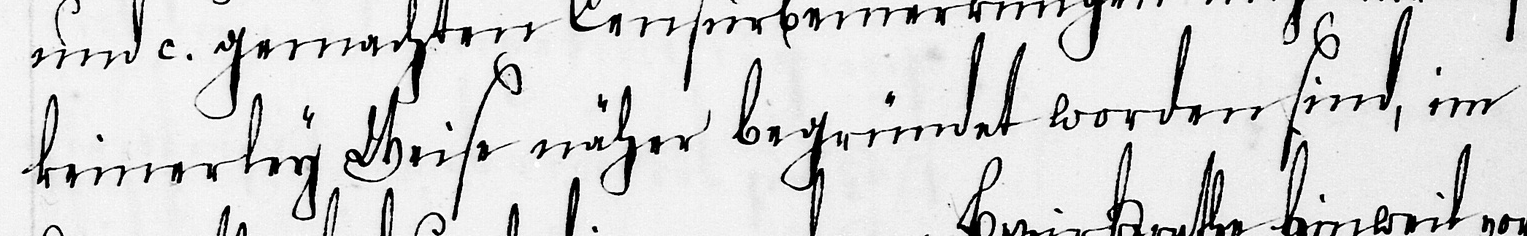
keinerley Weise näher begründet worden sind, im
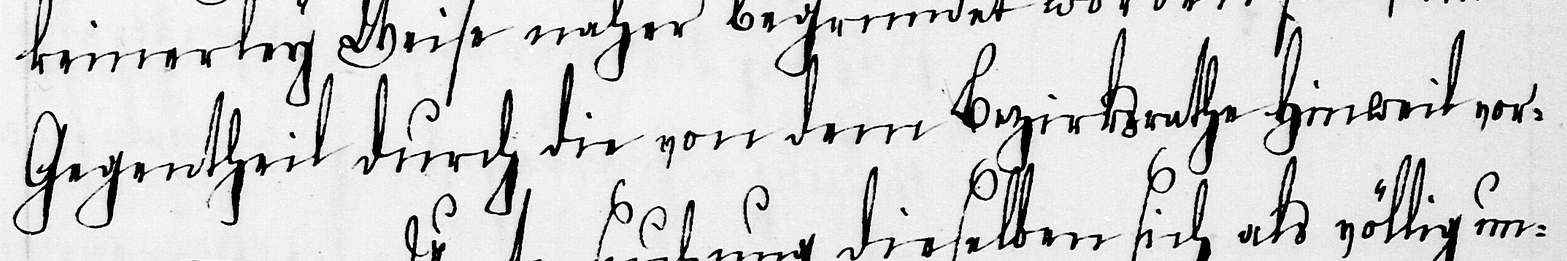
Gegentheil durch die von dem Bezirksrathe Hinweil vor¬
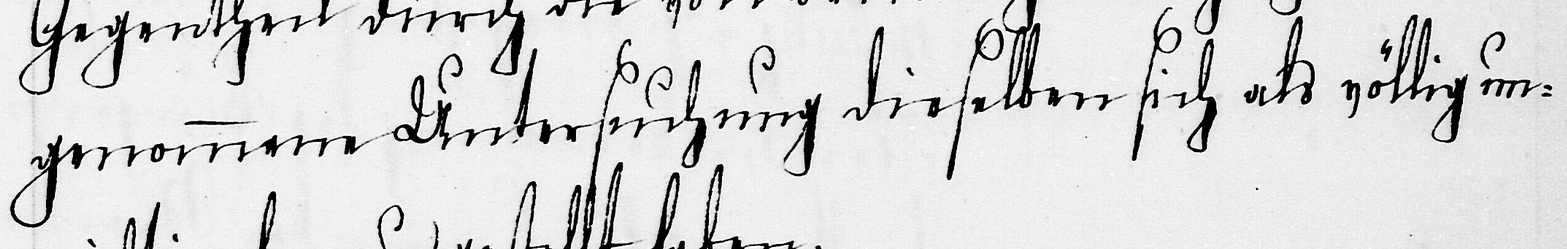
genommene Untersuchung dieselben sich als völlig un¬
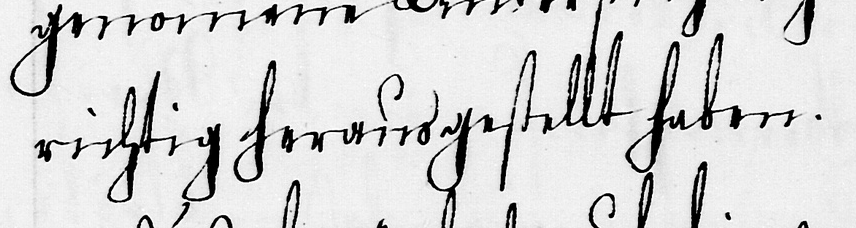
wichtig herausgestellt haben.
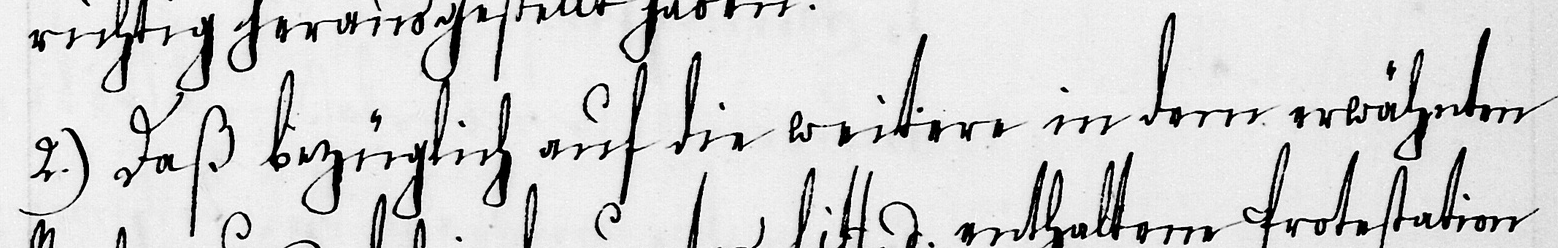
2.) Daß bezüglich auf die weitere in dem erwähnten
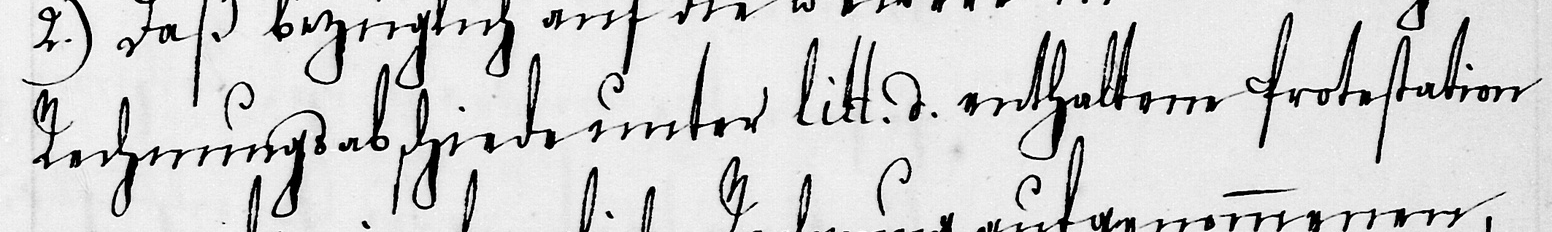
Rechnungsabschiede unter litt. d. enthaltene Protestation
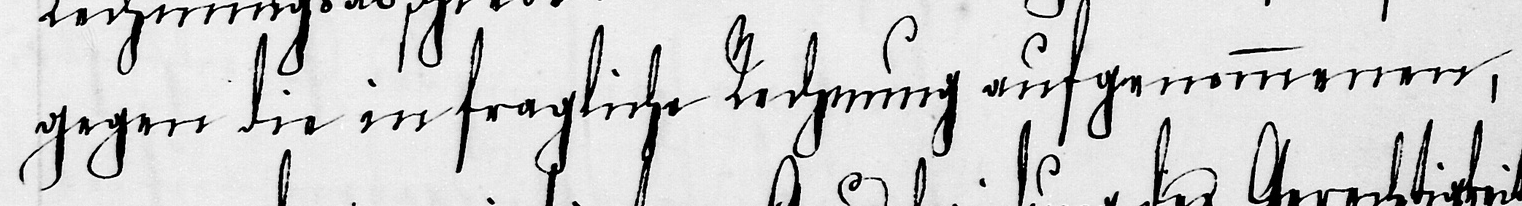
gegen die in fragliche Rechnung aufgenommenen,
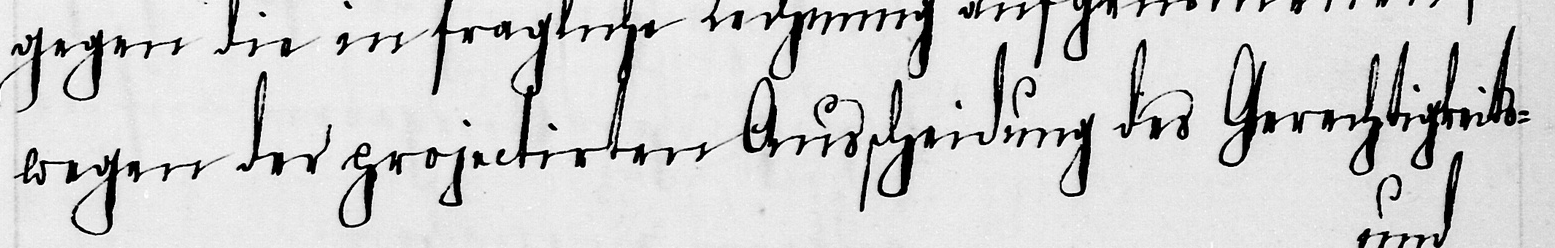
wegen der projectirten Ausscheidung des Gerechtigkeits-
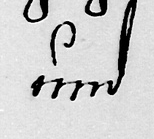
und
